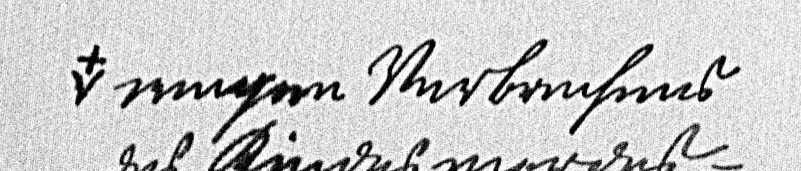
+ amgen Verbrechens
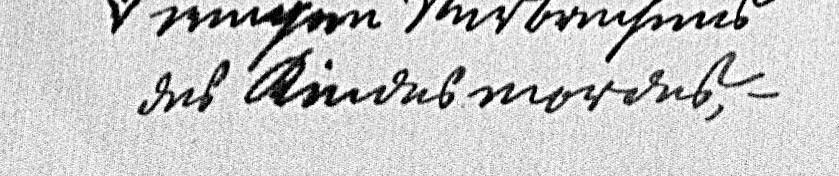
des Kindesmordes,-
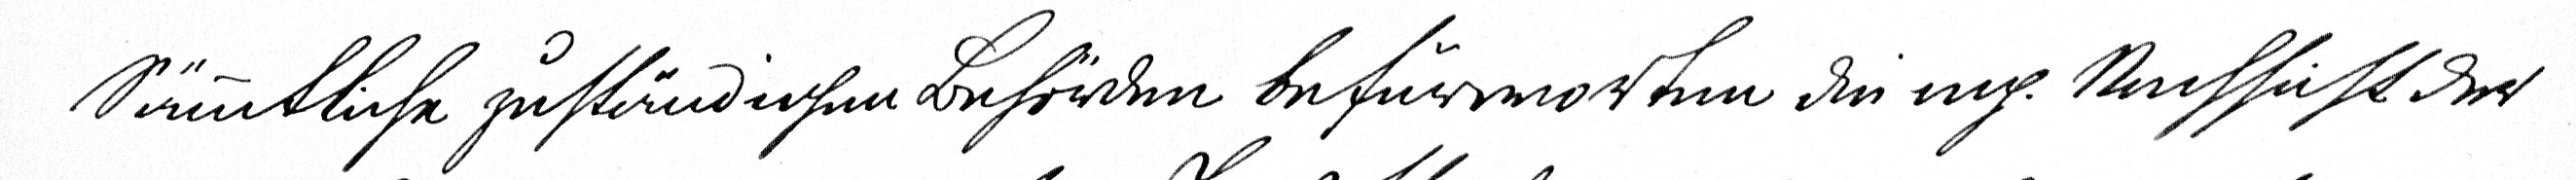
Sämmtliche zuständigen Behörden befürworten die ag. Nachsicht der
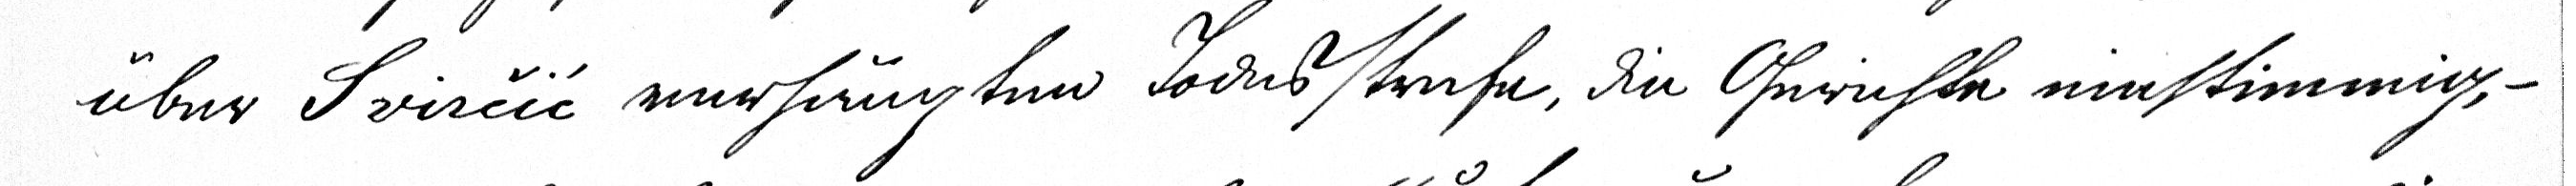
über Svirčić verhaupten Todesstrafe, die Gerichte einstimmig,-
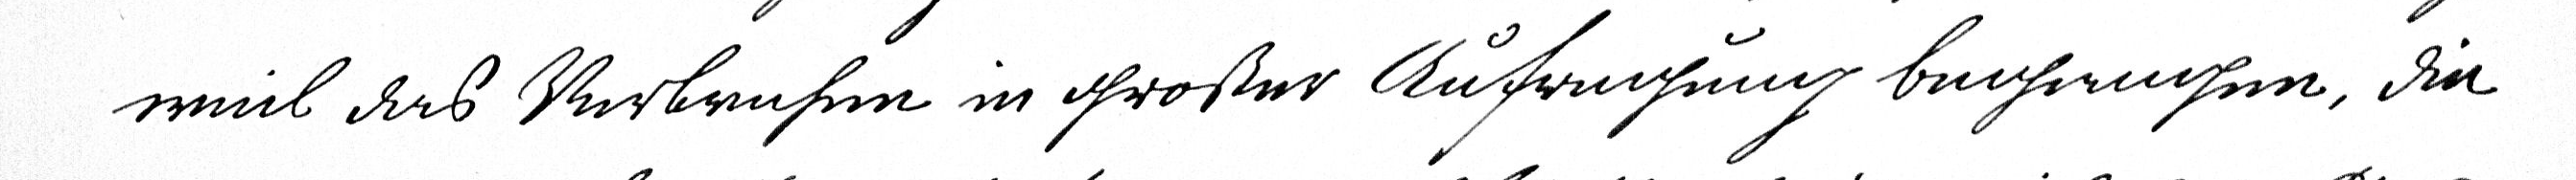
weil das Verbrechen in großer Aufragung begangen, die
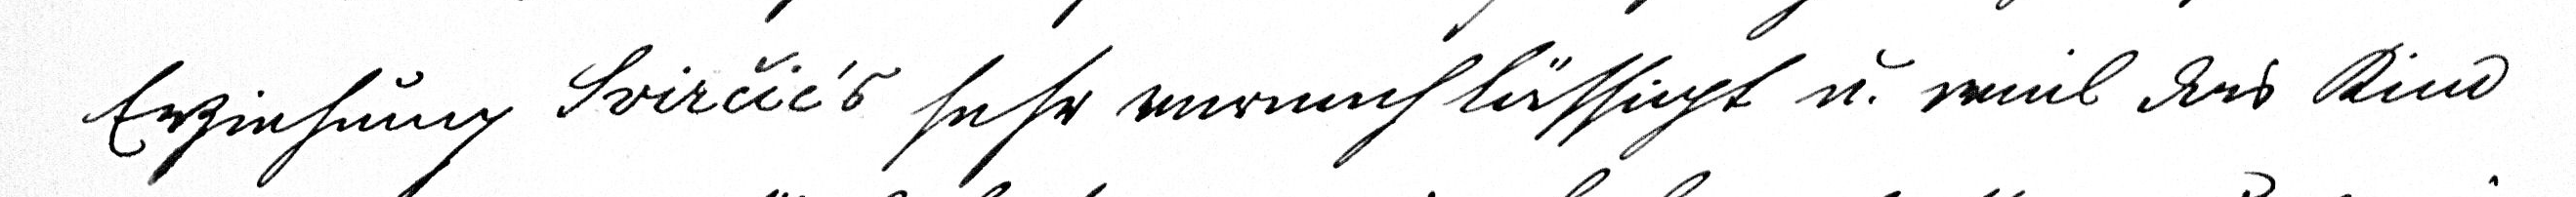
Erziehung Svirčić sehr vernachlässigt u. weil das Kind
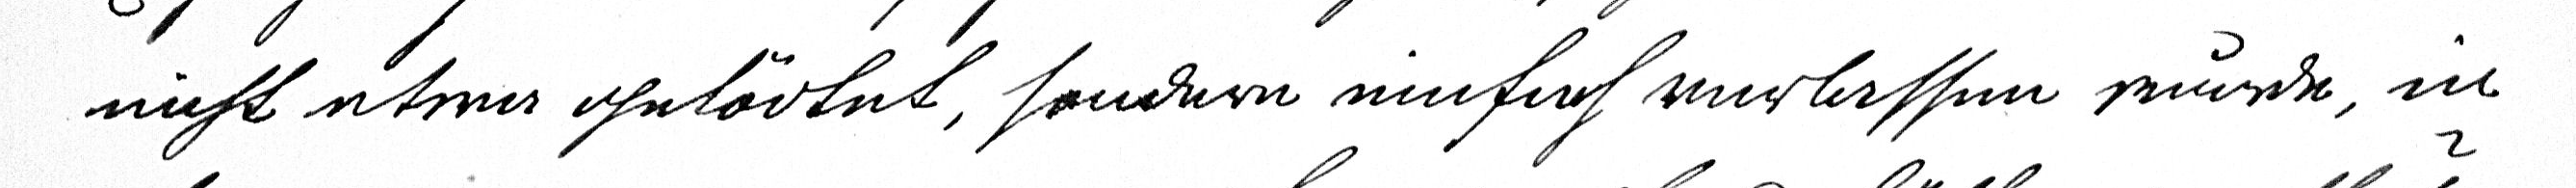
nicht etwa getödtet, sondern einfach verlassen wurde, in
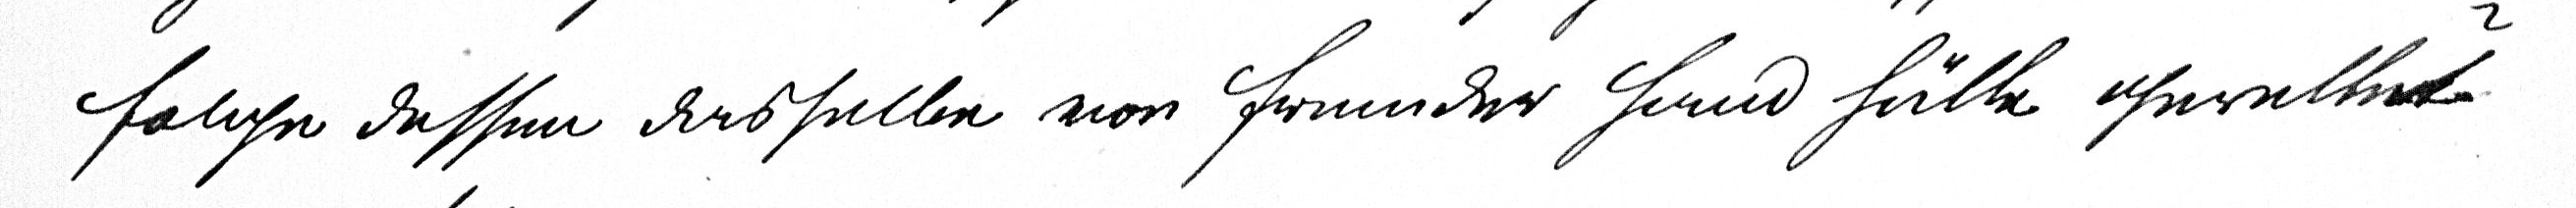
folge dessen dasselbe von fremder Hand hätte gerettet
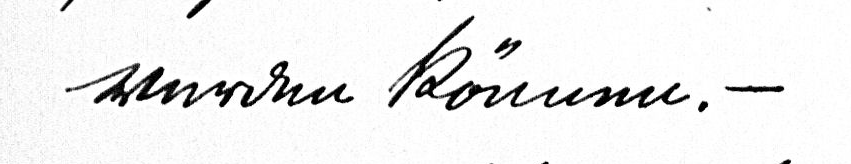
werden können.-
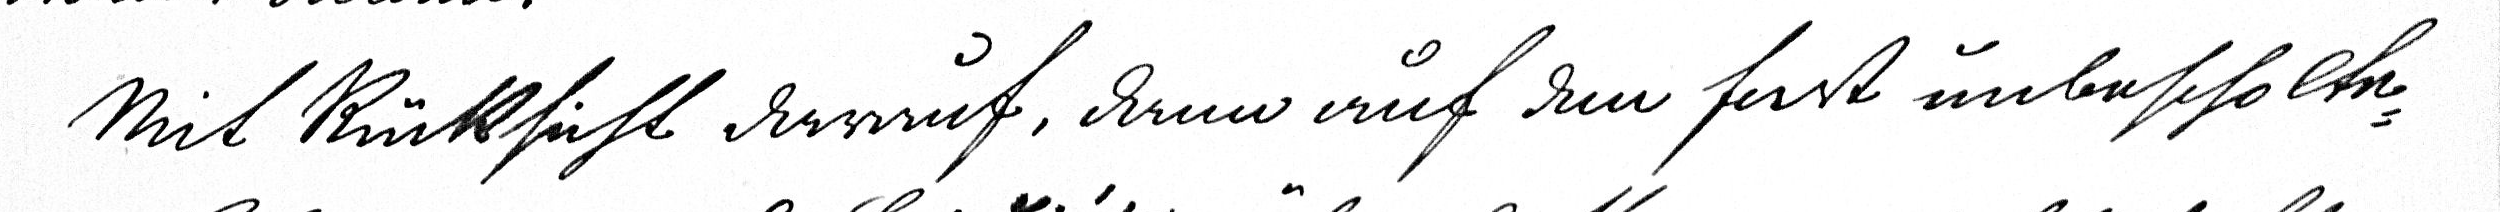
Mit Rücksicht darauf, dann auf den fart unbescholte¬
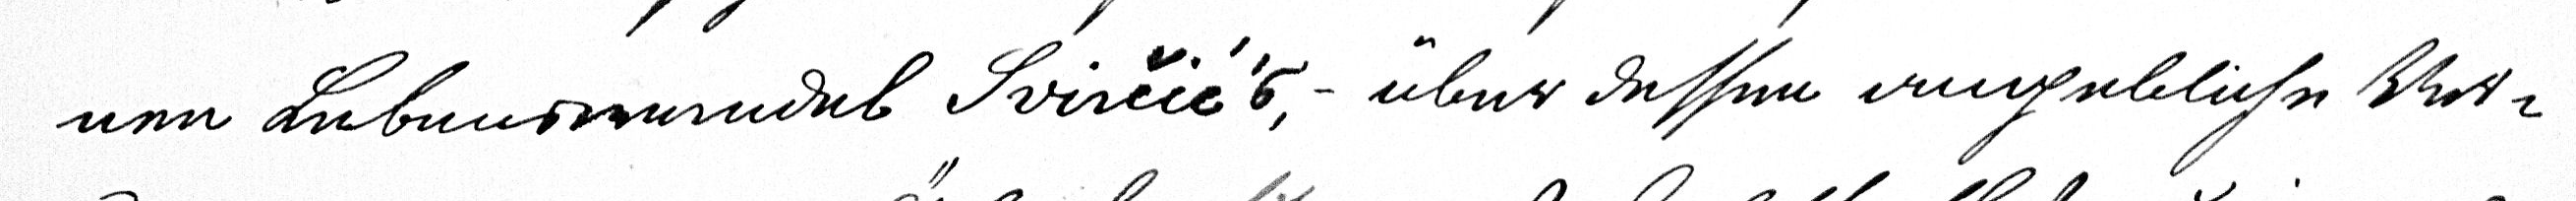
nen Lebenswandel Svirčić's, - über dessen angebliche Ver¬
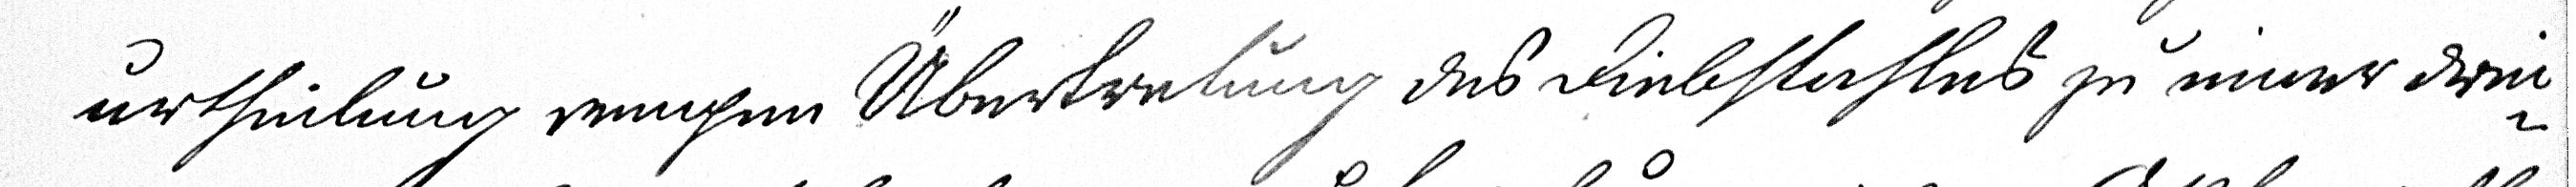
urtheilung wegen Übertretung des Diebstahles zu einer drei¬
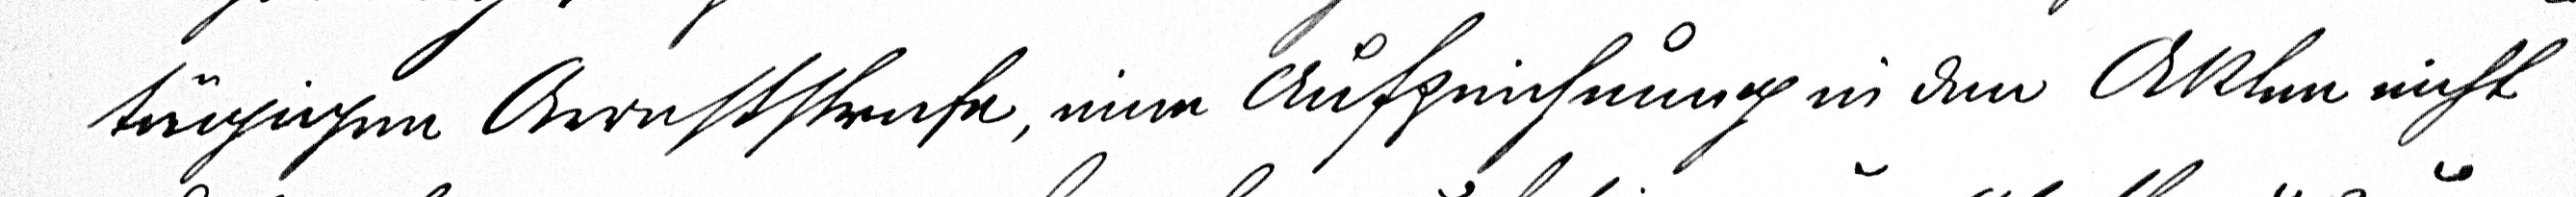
tägigen Arreststrafe, eine Aufzeichnung in den Akten nicht
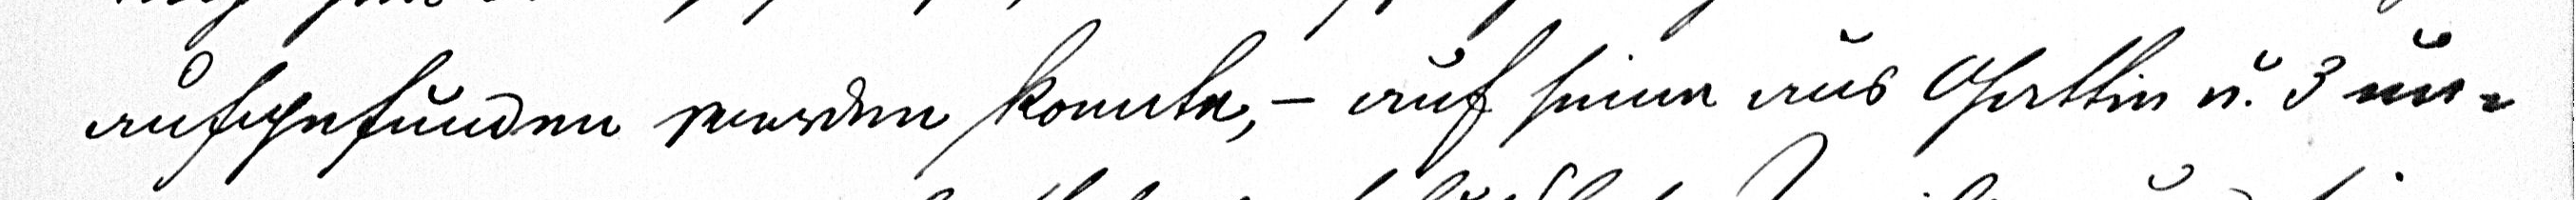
aufgefunden worden konnte,- auf seine aus Gattin u. 3 un¬
